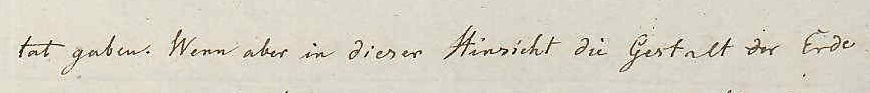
tat gaben. Wenn aber in dieser Hinsicht die Gestalt der Erde
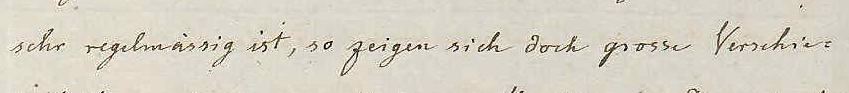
sehr regelmässig ist, so zeigen sich doch grosse Verschie-
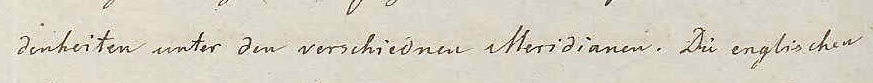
denheiten unter den verschiednen Meridianen. Die englischen
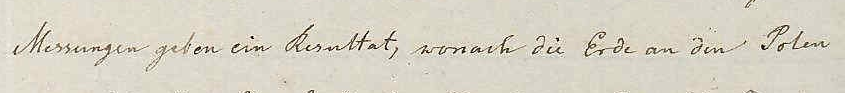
Messungen geben ein Resultat, wonach die Erde an den Polen
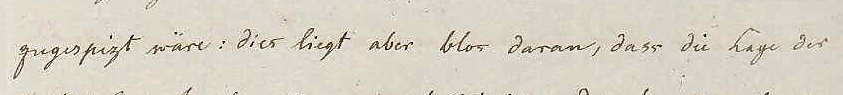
zugespizt wäre: dies liegt aber blos daran, dass die Lage der
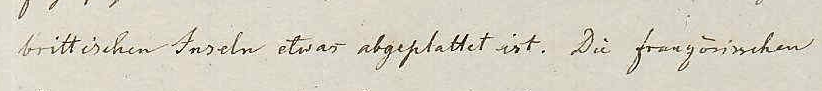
brittischen Inseln etwas abgeplattet ist. Die französischen
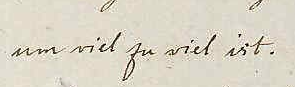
um viel zu viel ist.
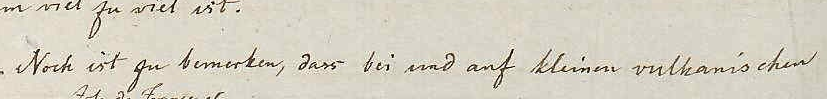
Noch ist zu bemerken, dass bei und auf kleinen vulkanischen
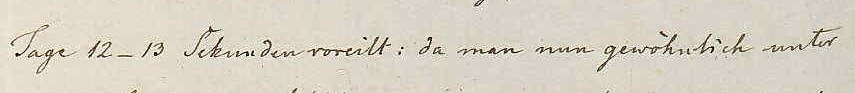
Tage 12–13 Sekunden voreilt: da man nun gewöhnlich unter
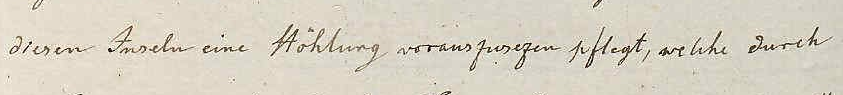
diesen Inseln eine Höhlung vorauszusezen pflegt, welche durch
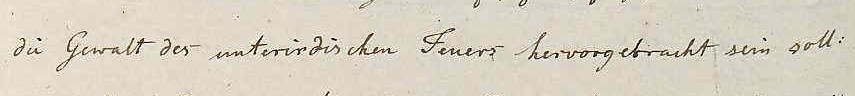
die Gewalt des unterirdischen Feuers hervorgebracht sein soll:
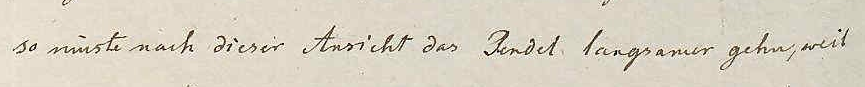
so müste nach dieser Ansicht das Pendel langsamer gehn, weil
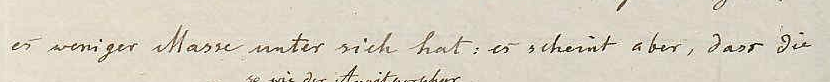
es weniger Masse unter sich hat: es scheint aber, dass die
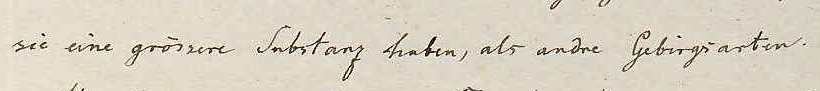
sie eine grössere Substanz haben, als andre Gebirgsarten.
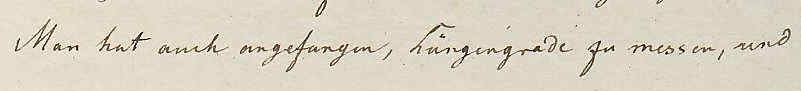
Man hat auch angefangen, Längengrade zu messen, und
